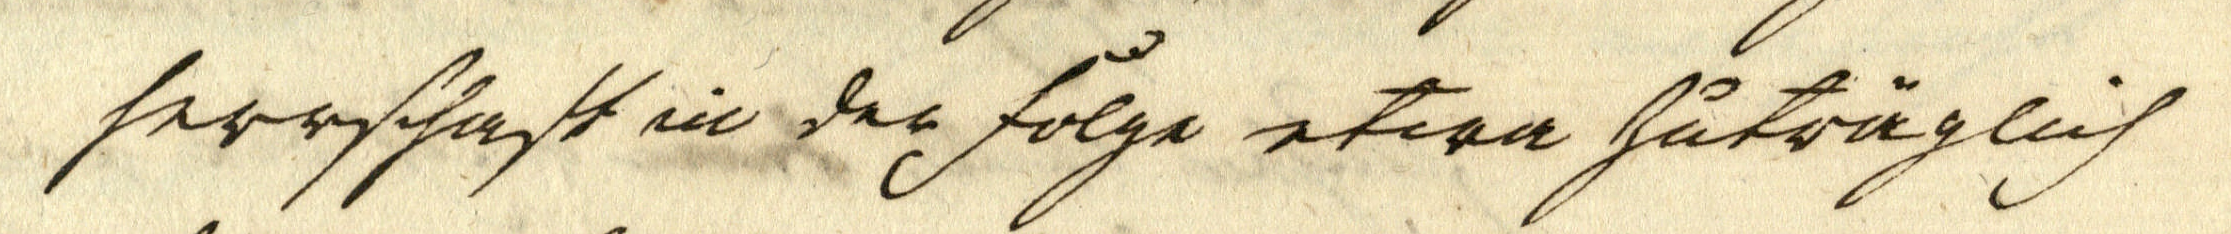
herrschaft in der Folge etwa zuträglich
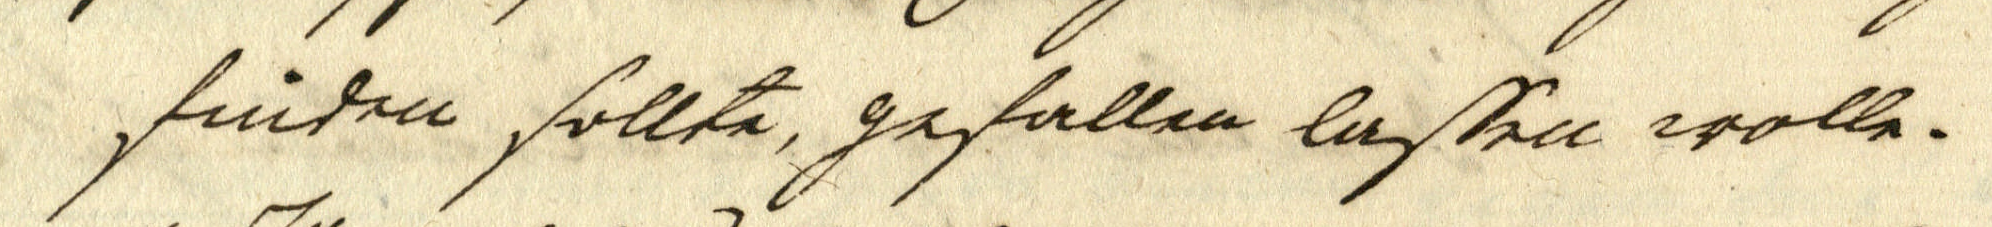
finden sollte, gefallen lassen wolle.
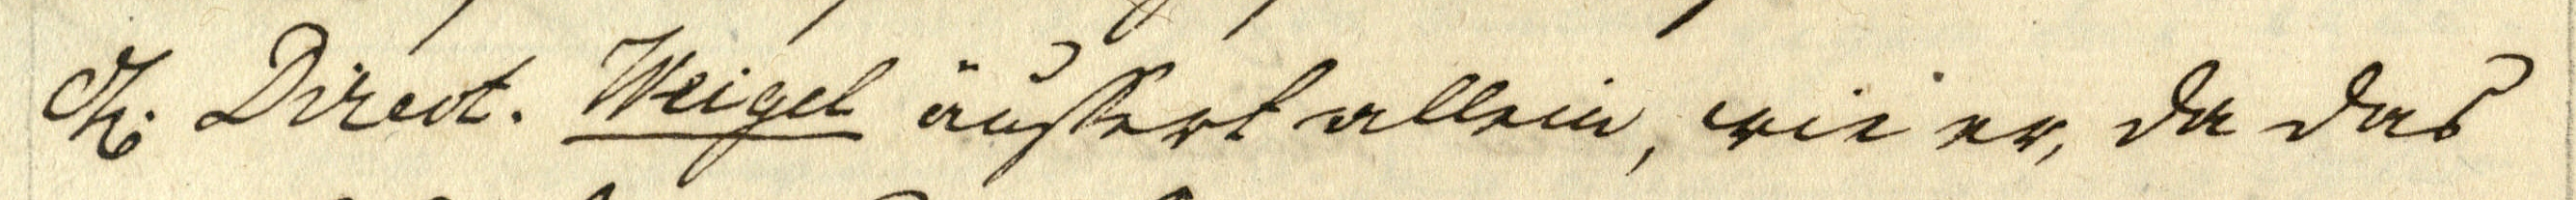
dh. Direct. Weigel äussert allein, wie er, da das
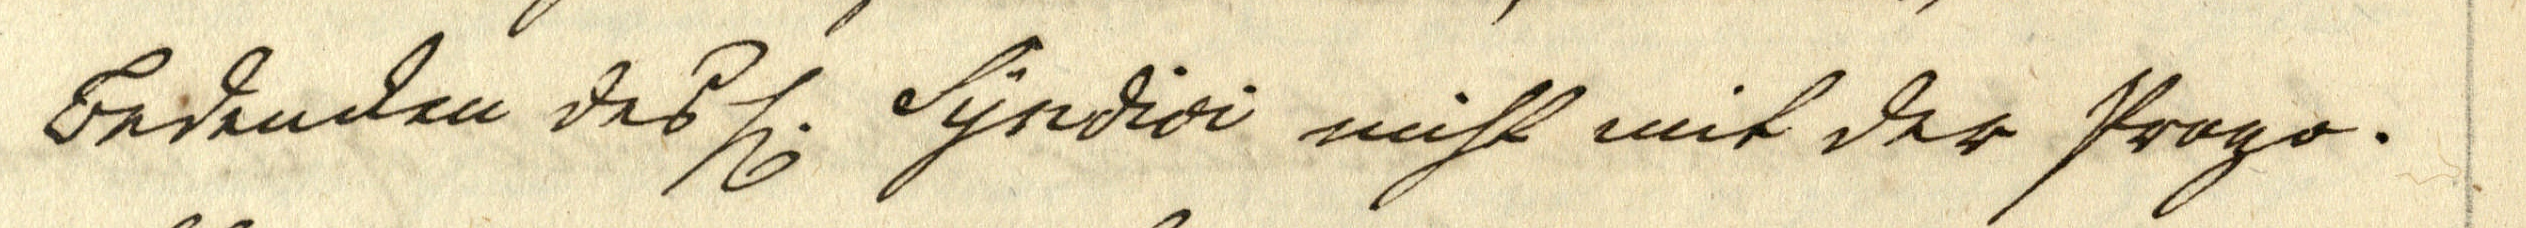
Bedenken des h. Syndici nicht mit der Propo-
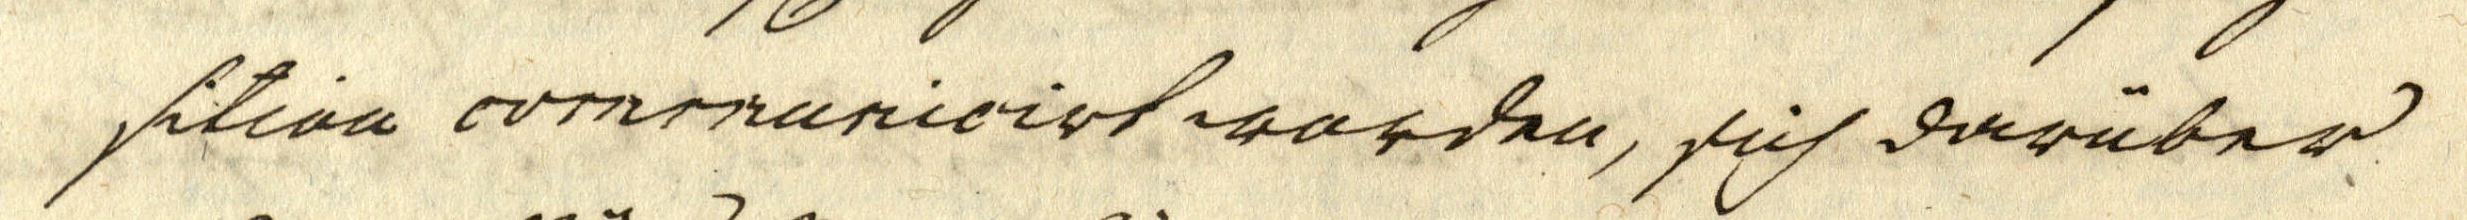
sition communicirt worden, sich darüber
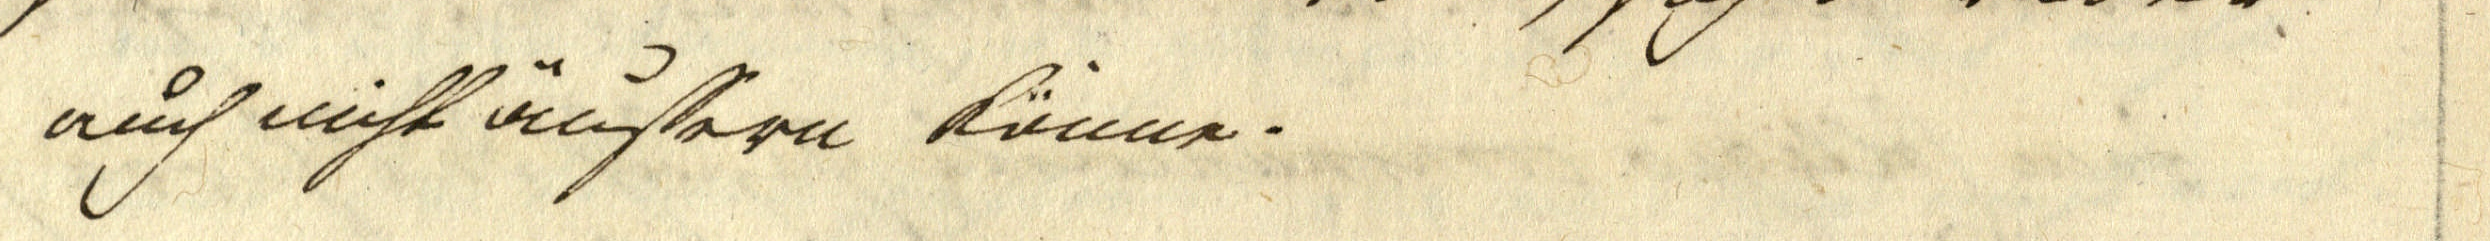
auch nciht äussern könne
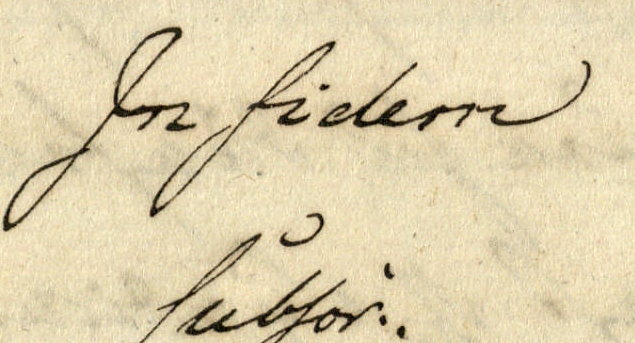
In fidem
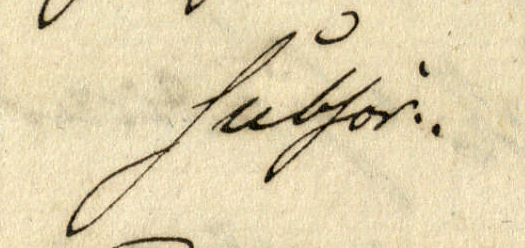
subscr.
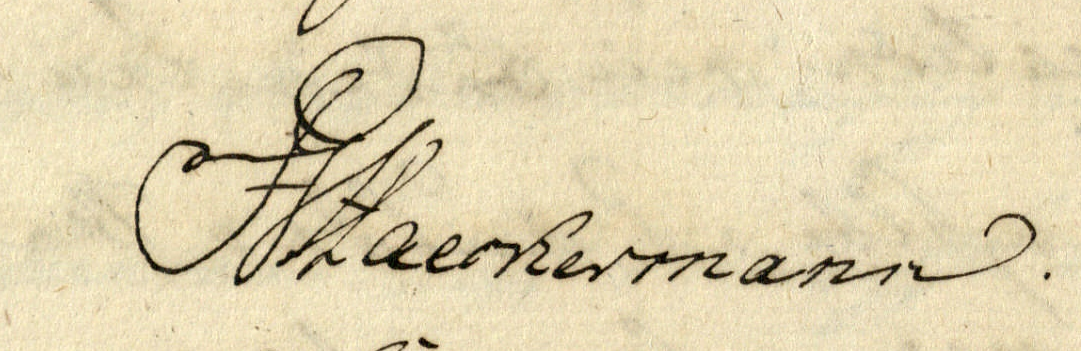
Haeckermann
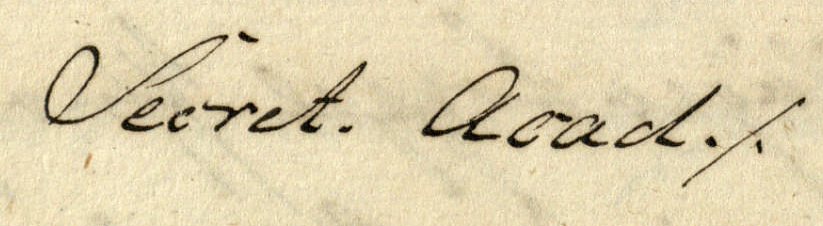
Secret. Acad.
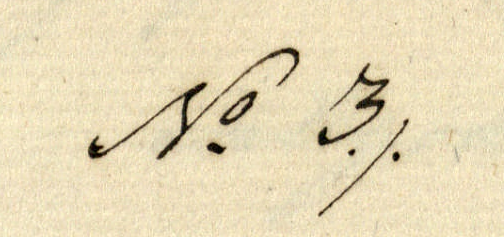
No. 3./.
